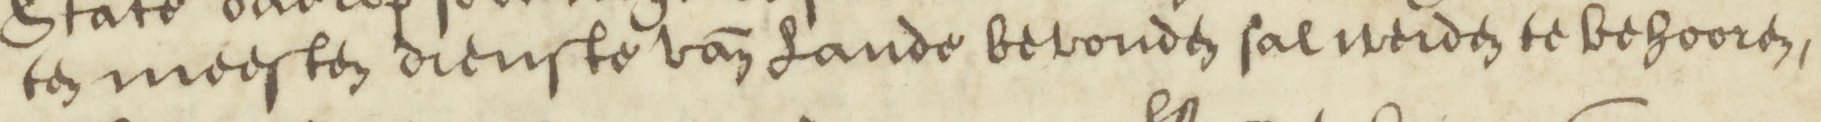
ten meesten dienste van Lande bevonden sal werden te behooren.
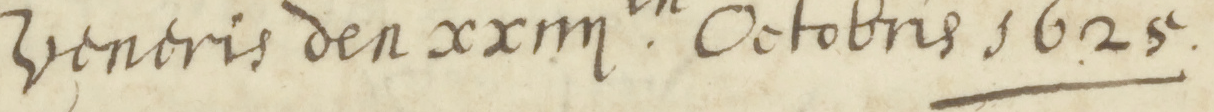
Veneris den xxiiijen. Octobris 1625.
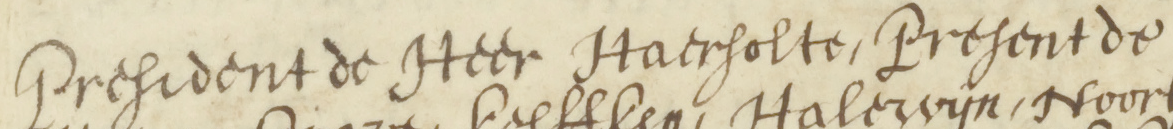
President de Heer Haersolte, Present de
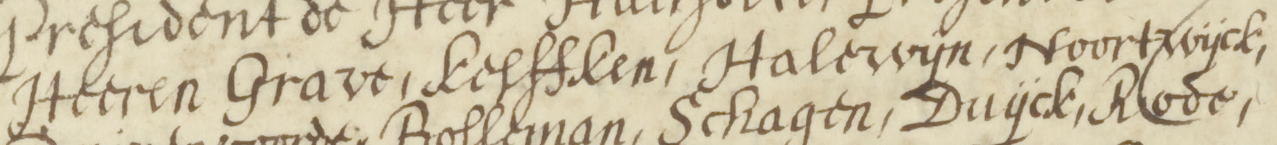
Heeren Grave, Kelffken, Halewijn, Noortwijck,
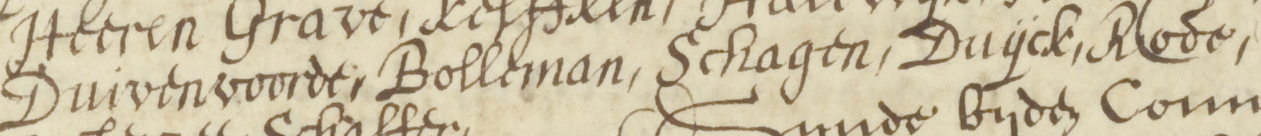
Duivenvoorde, Bolleman, Schagen, Duijck, Rode,
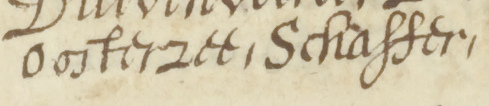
Oosterzee, Schaffer,
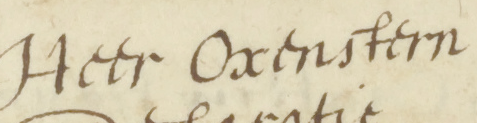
Heer Oxenstern
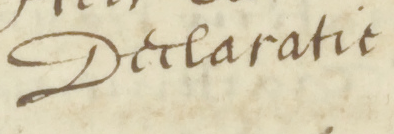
Declaratie
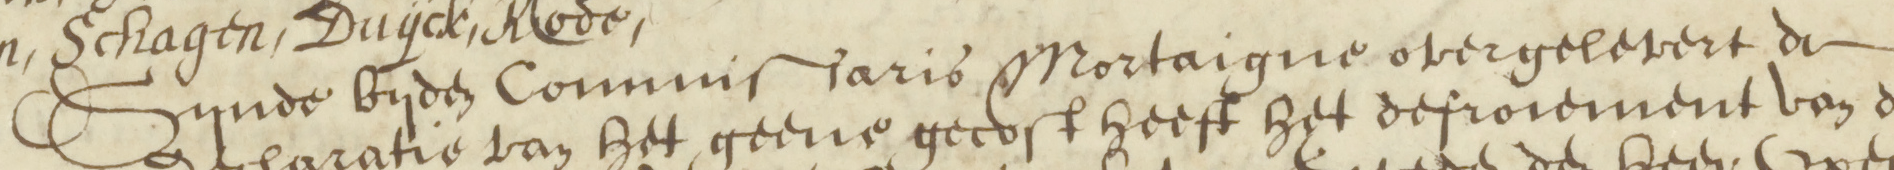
Synde byden Commissaris Mortaigne overgelevert de
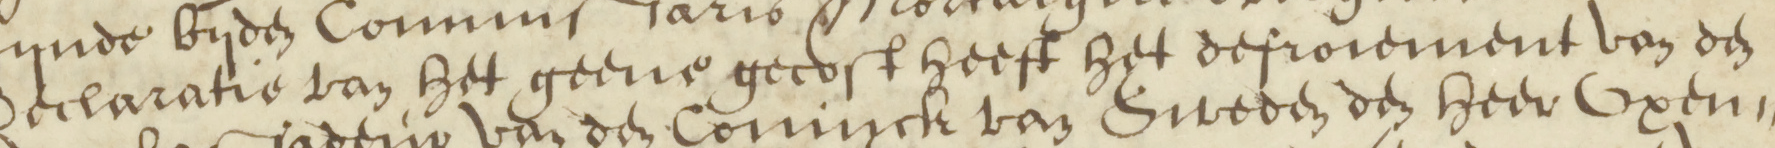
declaratie van het geene gecost heeft het defroiement van den
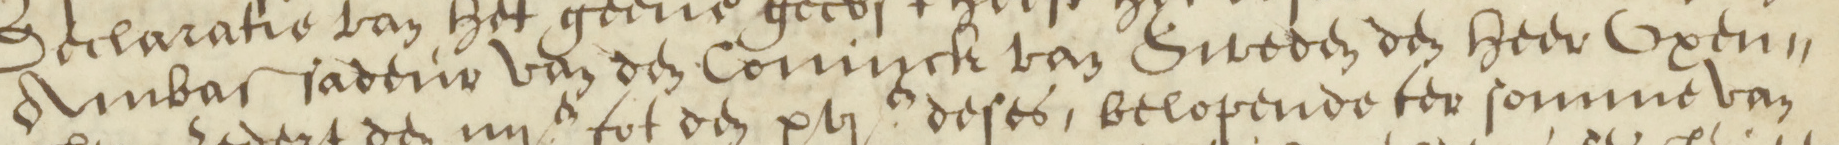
Ambassadeur van den Coninck van Sweden den heer Oxen„
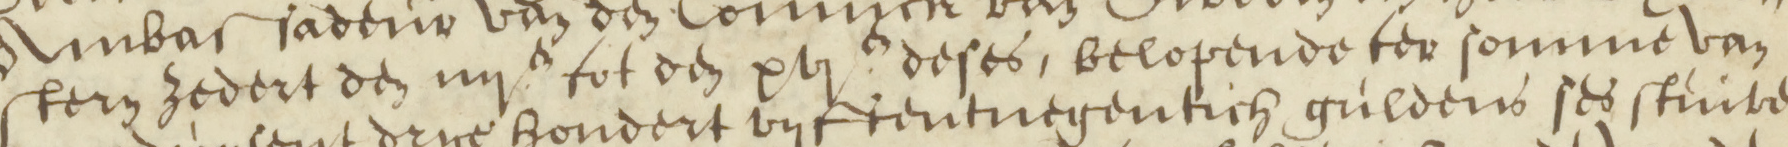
stern zedert den iiijen. tot den xvien. deses, belopende ter somme van
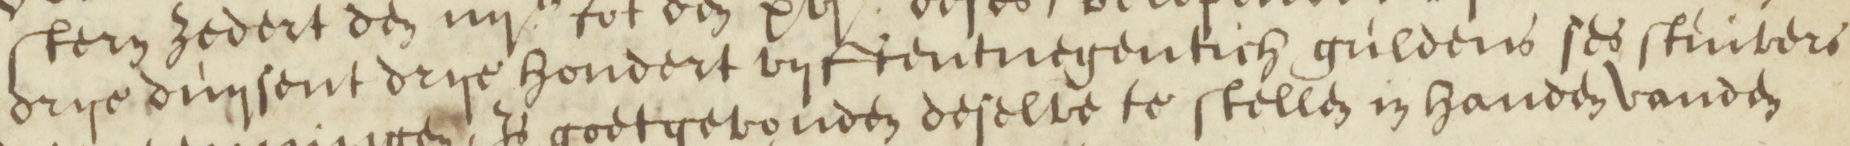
drye duysent drye hondert vyffentnegentich guldens ses stuivers
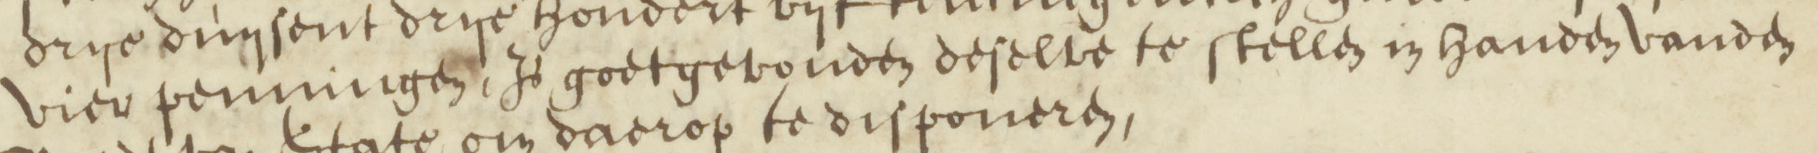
vier penningen. Is goetgevonden deselve te stellen in handen vanden
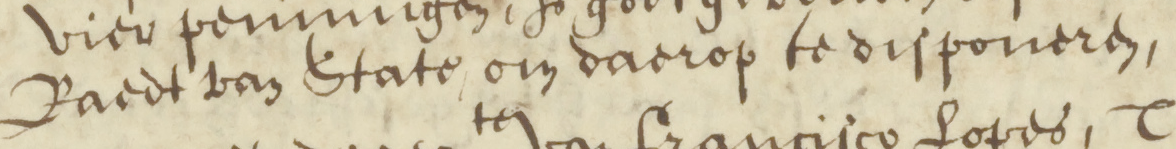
Raedt van State om daerop te disponeren,
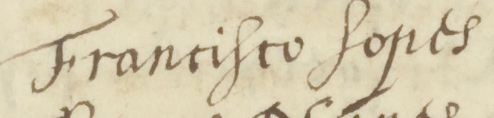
Francisco Lopes
